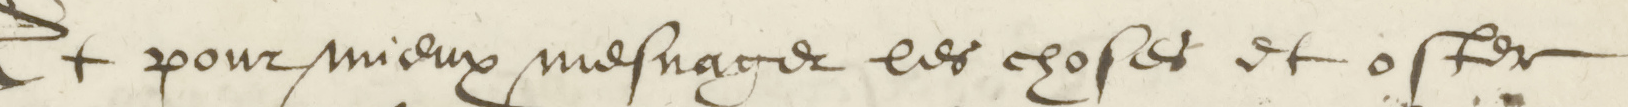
Et pour mieux mesnager les choses et oster
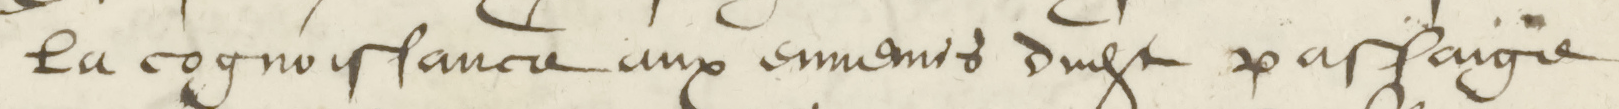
la cognoissance aux ennemis dudt passaige
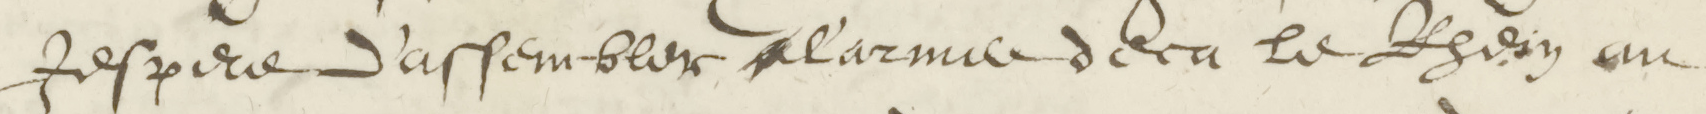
Jespere d'assembler a l'armee deca le Rhein au
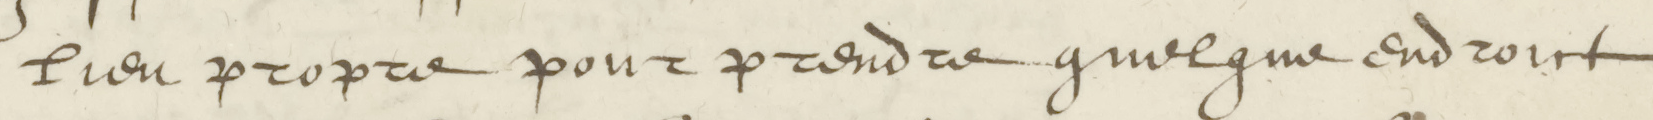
lieu propre pour prendre quelque endroict
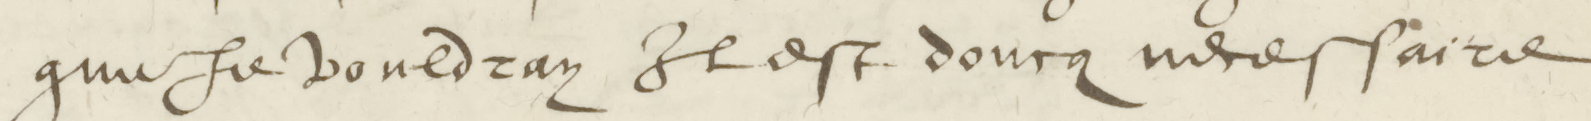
que Je vouldray IL est doncq necessaire
